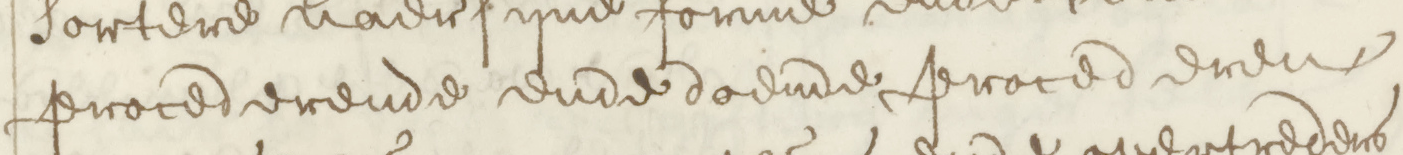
procederende ende doende procederen
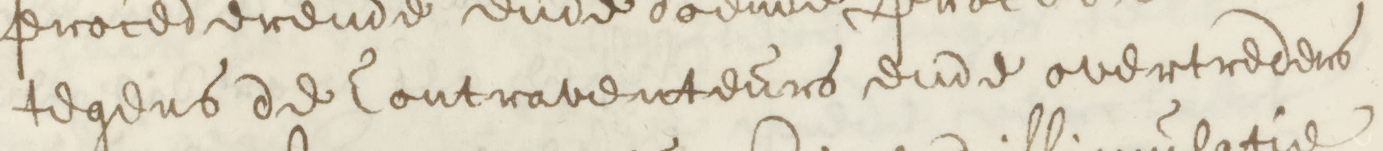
tegens de Contraventeurs ende overtreders
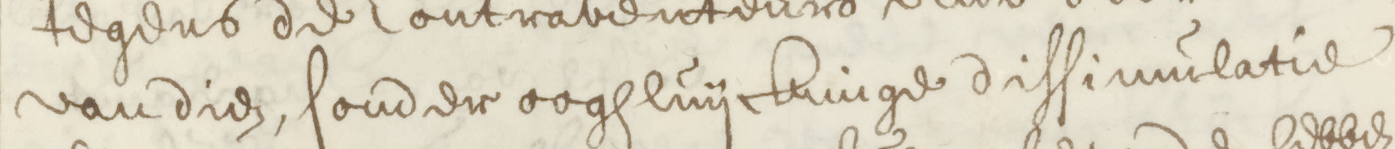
vandien, sonder ooghluijckinge dissimulatie
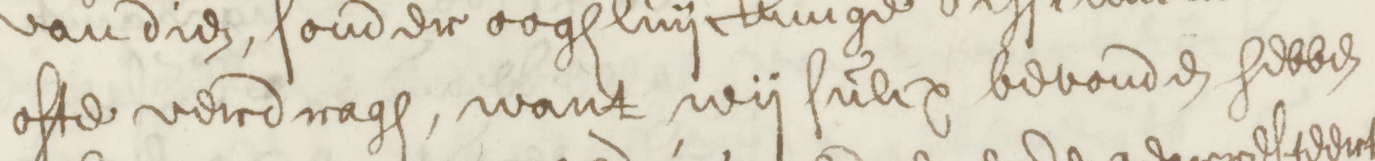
ofte verdragh, want wij sulcx bevonden hebben
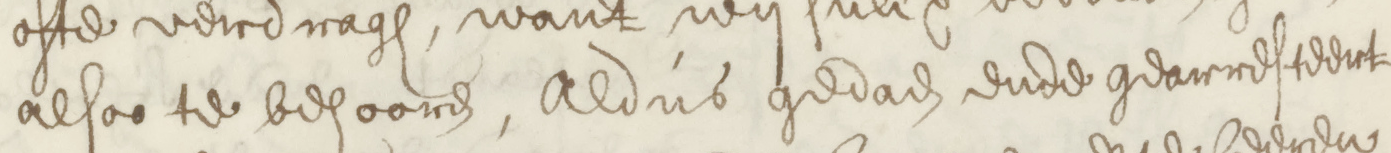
alsoo te behooren. Aldus gedaen ende gearresteert
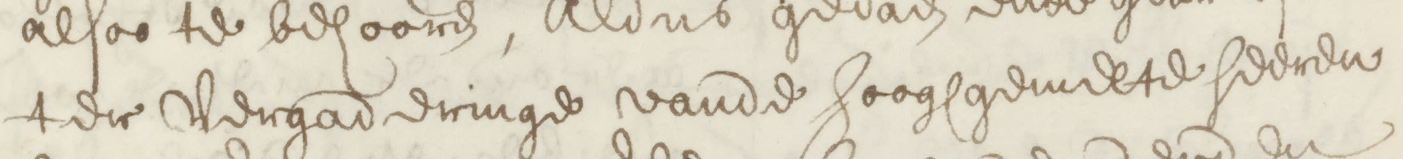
ter Vergaderinge vande Hooghgemelte heeren
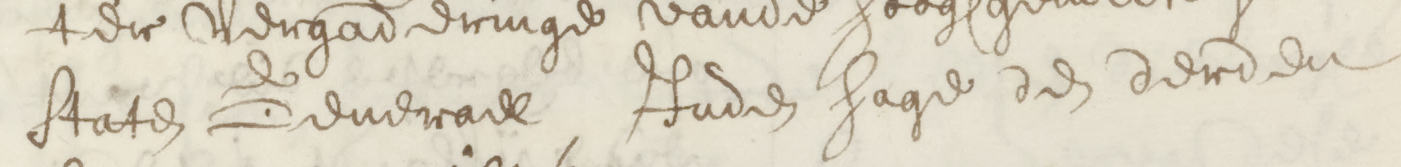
Staten Generael Inden Hage den derden
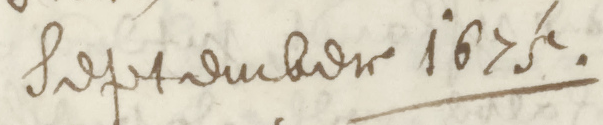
September 1675.
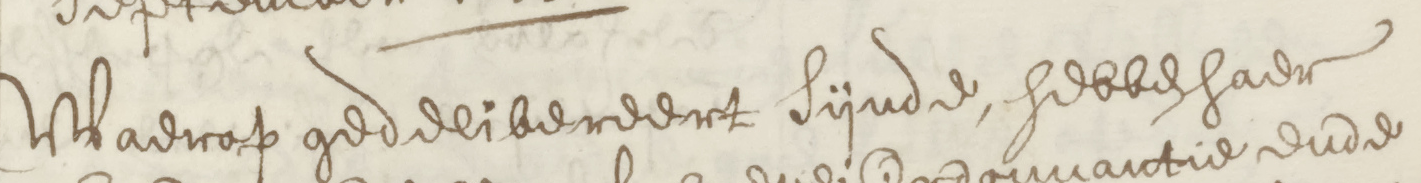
Waerop gedelibereert sijnde, hebben haer
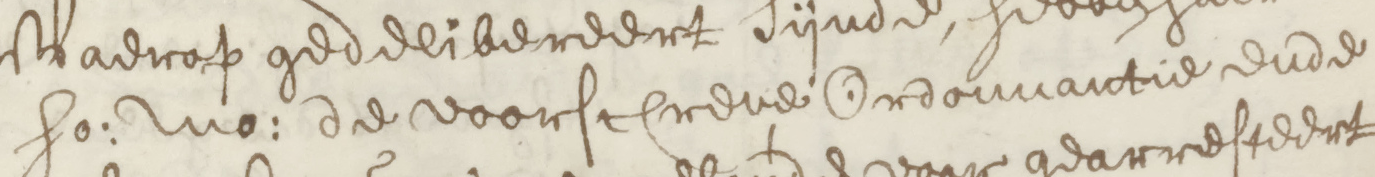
ho:Mo: de voorschreve Ordonnantie ende
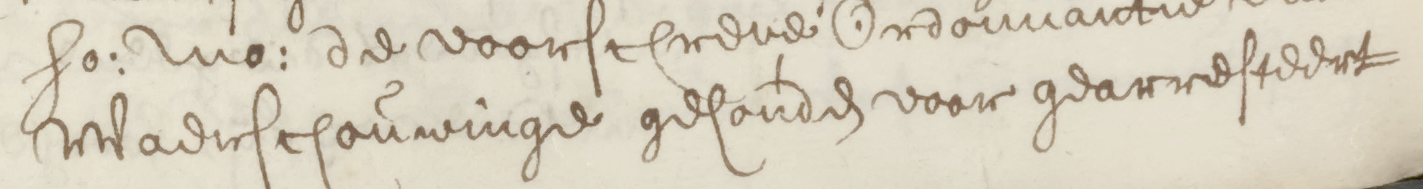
Waerschouwinge gehouden voor gearresteert
